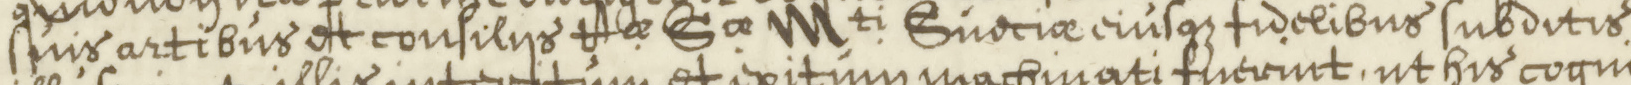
suis artibus et consiliis Ræ. Sæ. Mti. Sueciæ eiusque fidelibus subditis
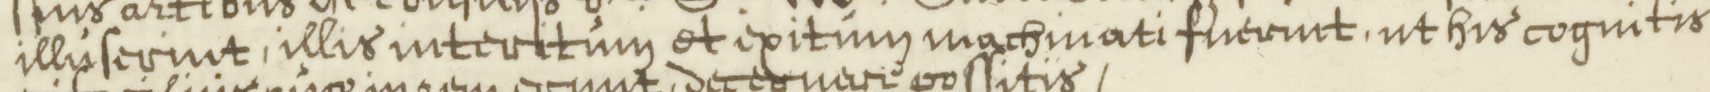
illuserint, illis interitum et exitum machinati fuerint, ut his cognitis
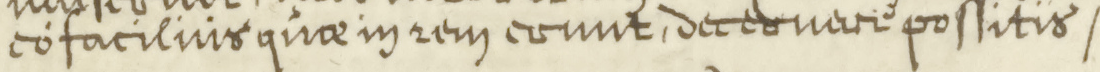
eo facilius quæ in rem erunt decernere possitis.
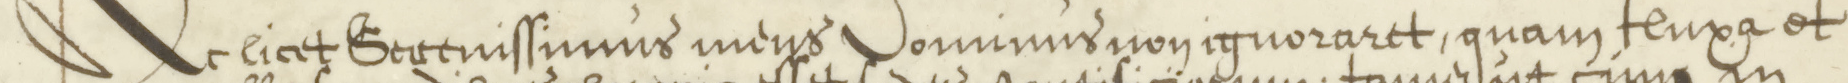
Ac licet Serenissimus meus Dominus non ignoraret, quam fluxa et
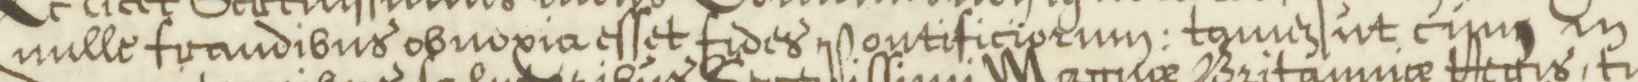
mille fraudibus obnoxia esset fides Pontificiorum : tamen ut cum in
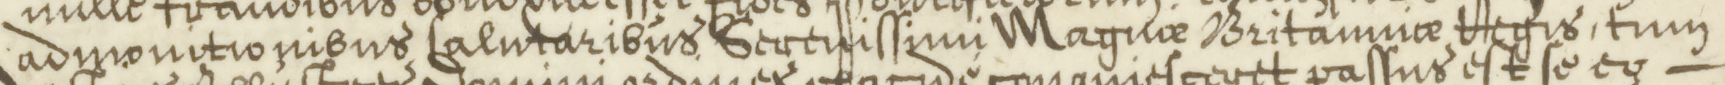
admonitionibus salutaribus Serenissimi Magnæ Britanniæ Regis, tum
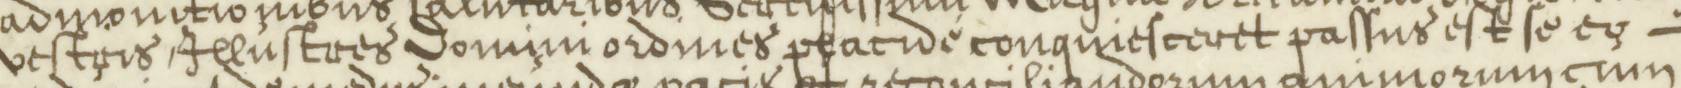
vestris, Illustres Domini ordines placide conquiescerit passus est se eo
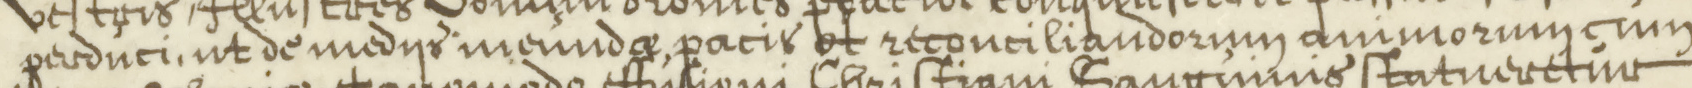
perduci, ut de mediis ineundæ pacis et reconciliandorum animorum cum
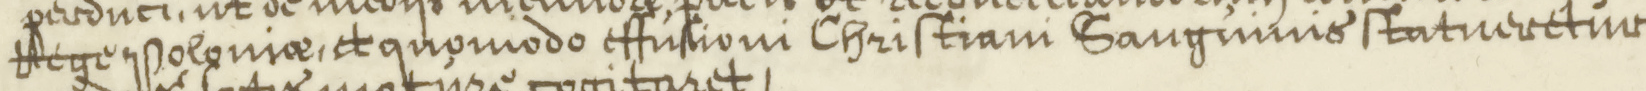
Rege Poloniæ, et quomodo effusioni Christiani Sanguinis statueretur
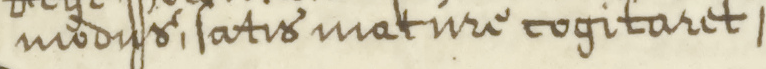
modus, satis mature cogitaret.
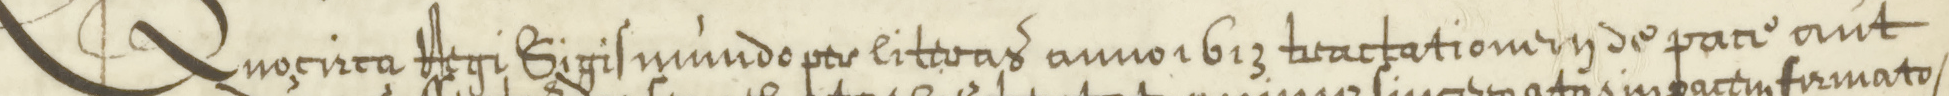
Quocirca Regi Sigismundo per literas anno 1613 tractationem de pace aut
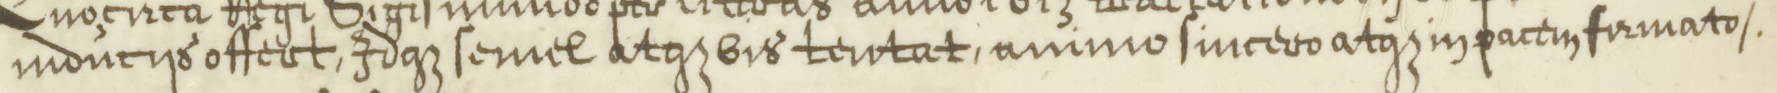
induciis offert, Idque semel atque bis tentat, animo sincero atque in pacem firmato.
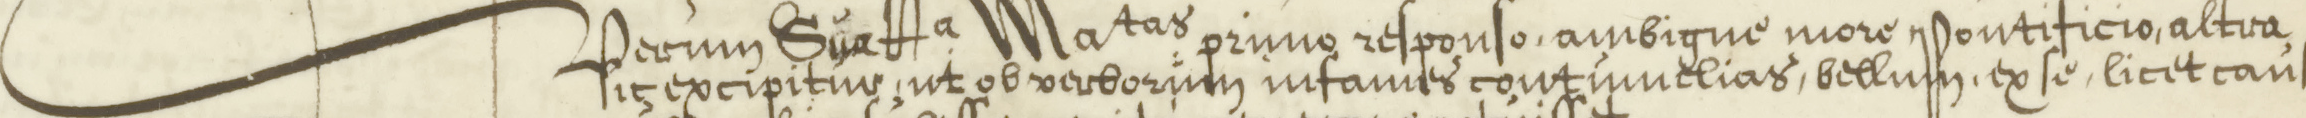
Verum Sua Ra. Matas, primo responso, ambigue more Pontificio, altra
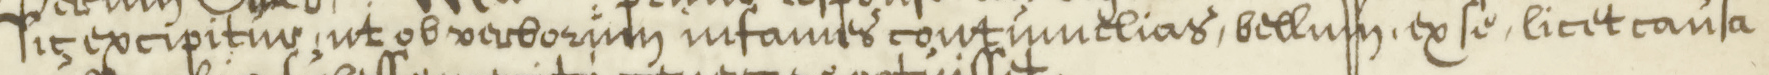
sic excipitur, ut ob verborum infames contumelias, bellum ex se licet causa
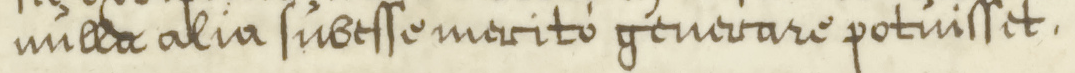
nulla alia subesse merito generare potuisset.
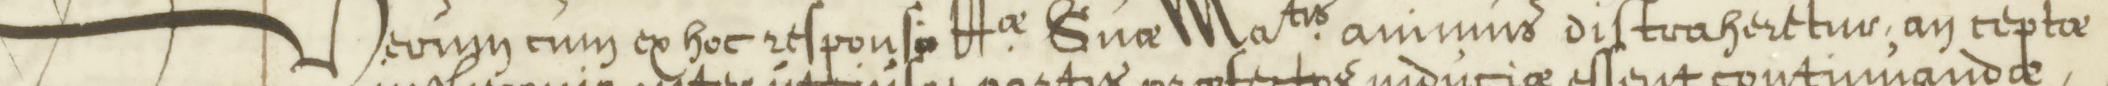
Verum cum ex hoc responso Ræ. Suæ Matis. animus distraheretur, an ceptæ
